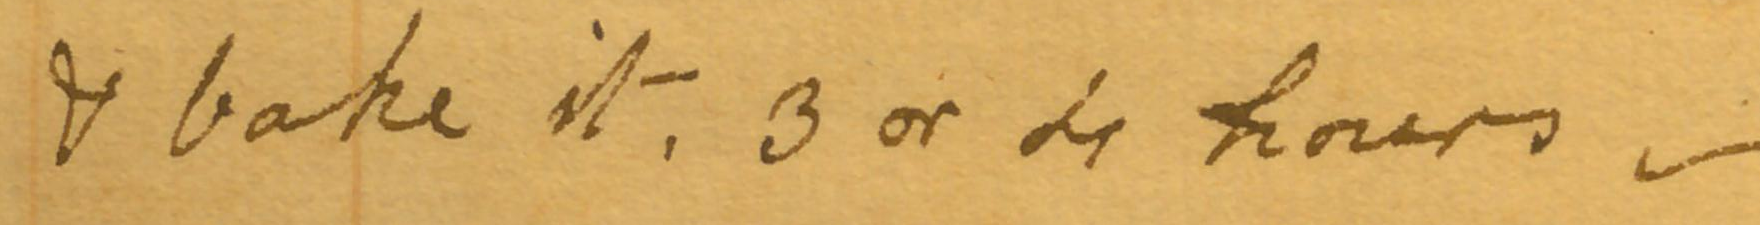& bake it, 3 or 4 hours-
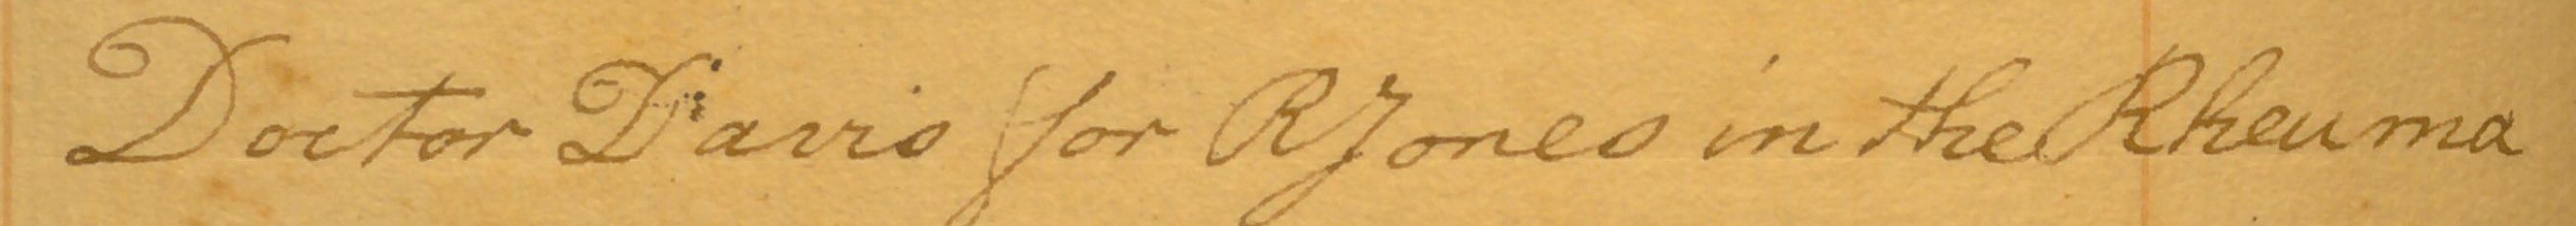Doctor Davis for R Jones in the Rheuma
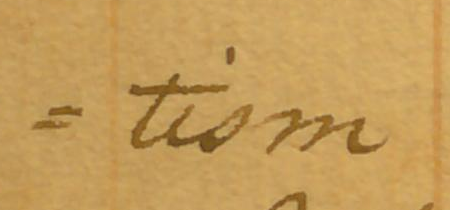-tism
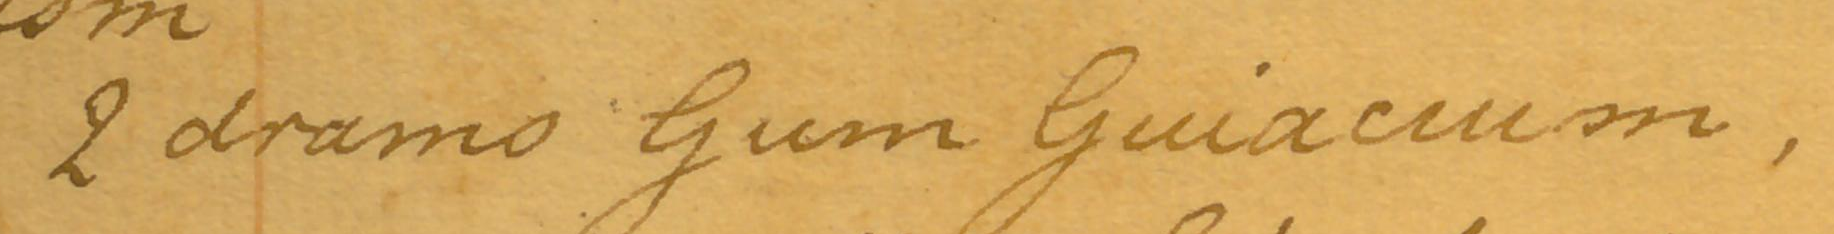2 drams Gum Guiacum,
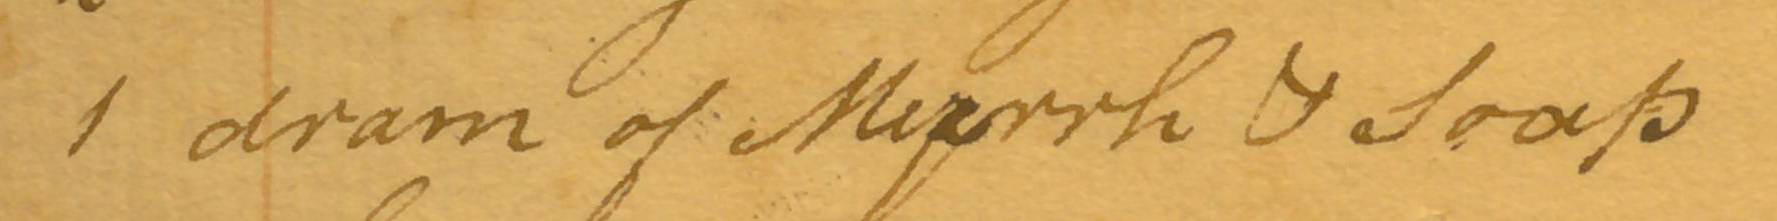1 dram of Myrrh & soap
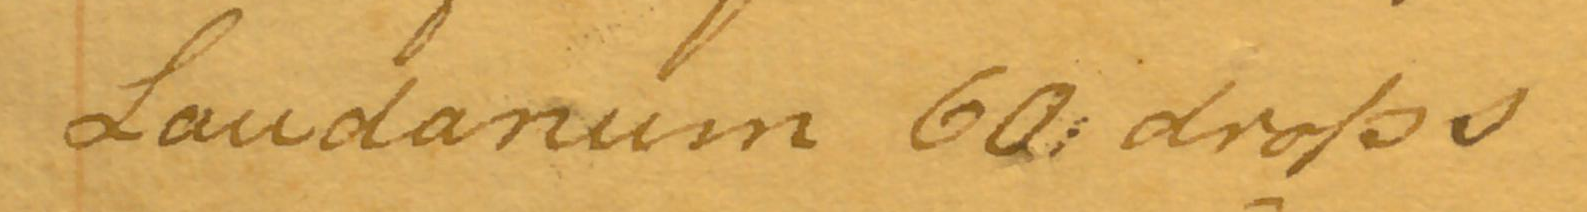Laudanium 60 drops
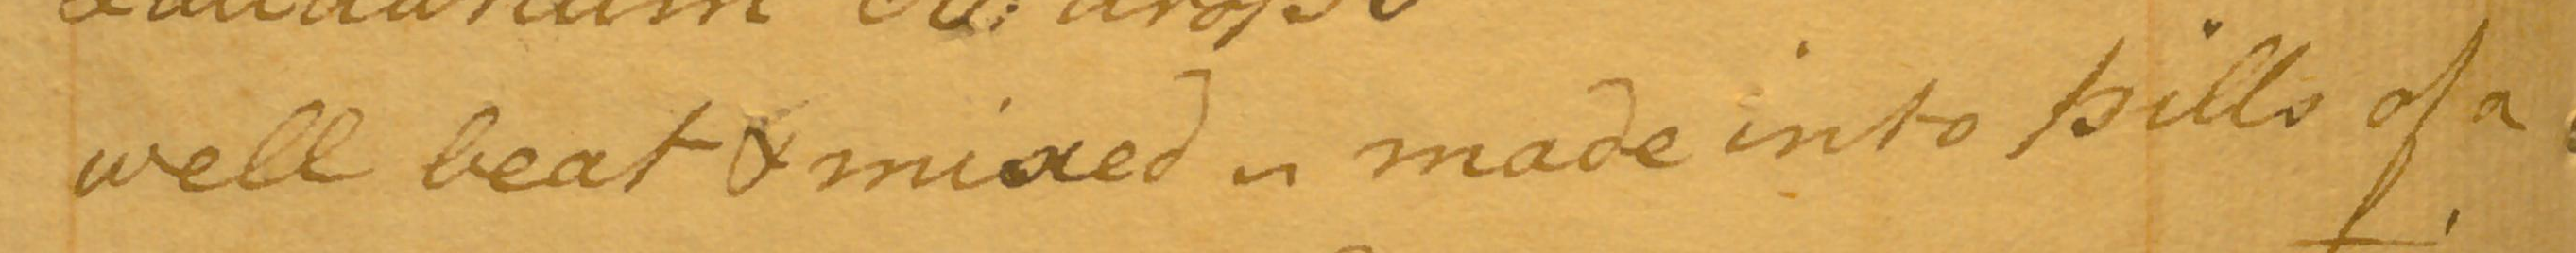well beat & mixed- made into pills of a
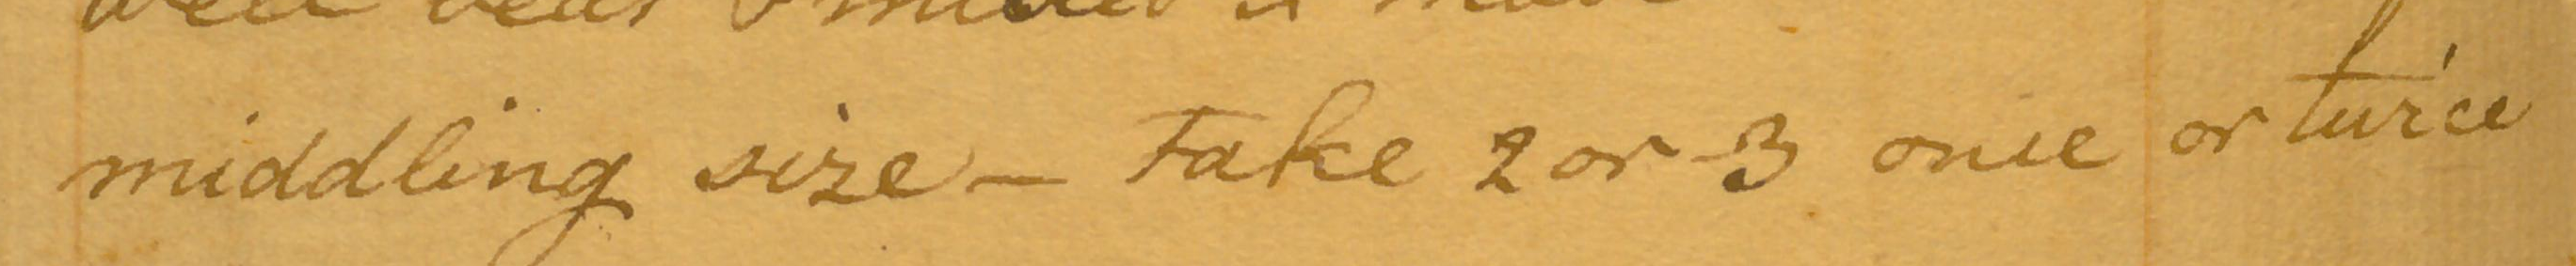middling size- take 2 or 3 once or twice
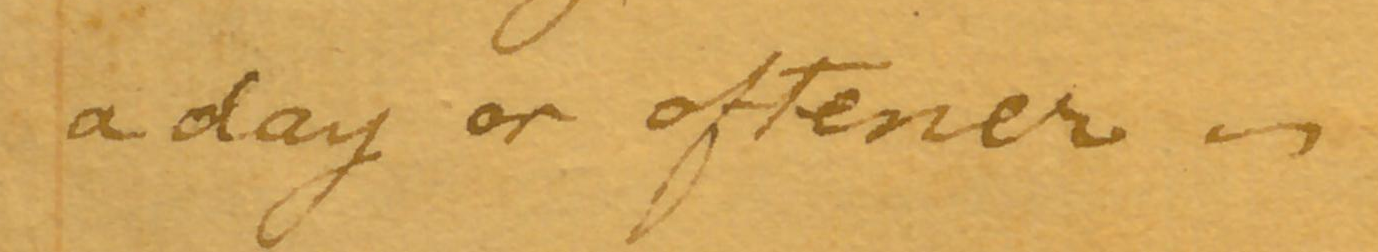a day or oftener-
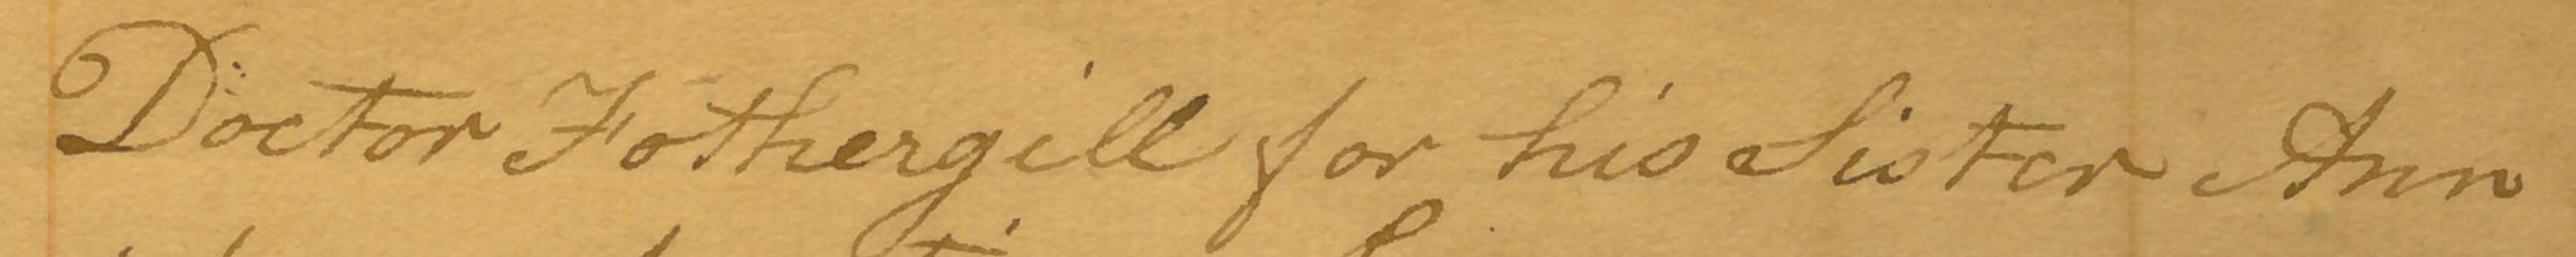Doctor Fothergill for his Sister Ann
